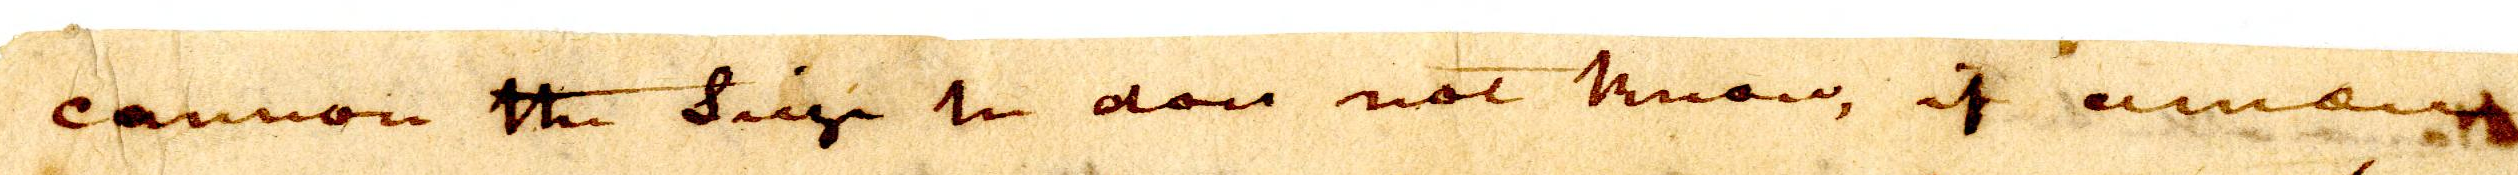cannon the Sign we do not know, if a more
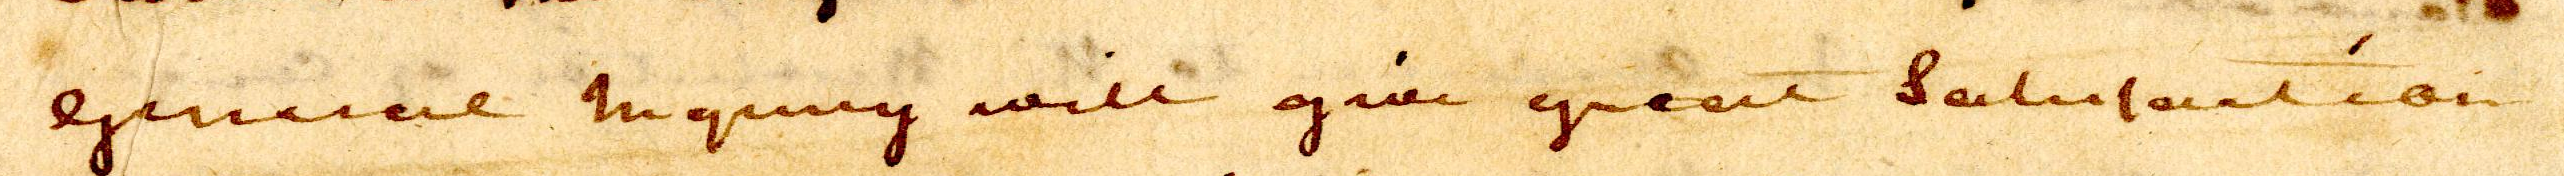general Inquiry will give great Satisfaction
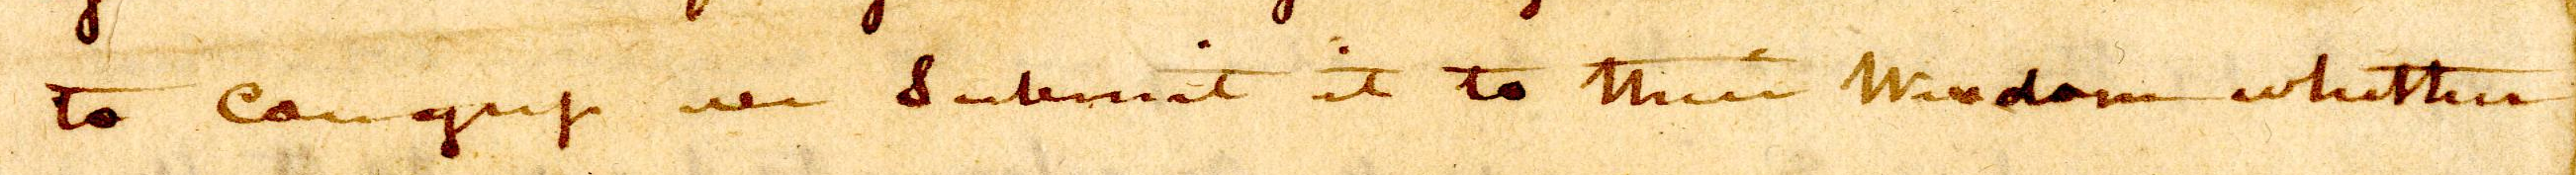to Congress we Submit it to their Wisdom whether
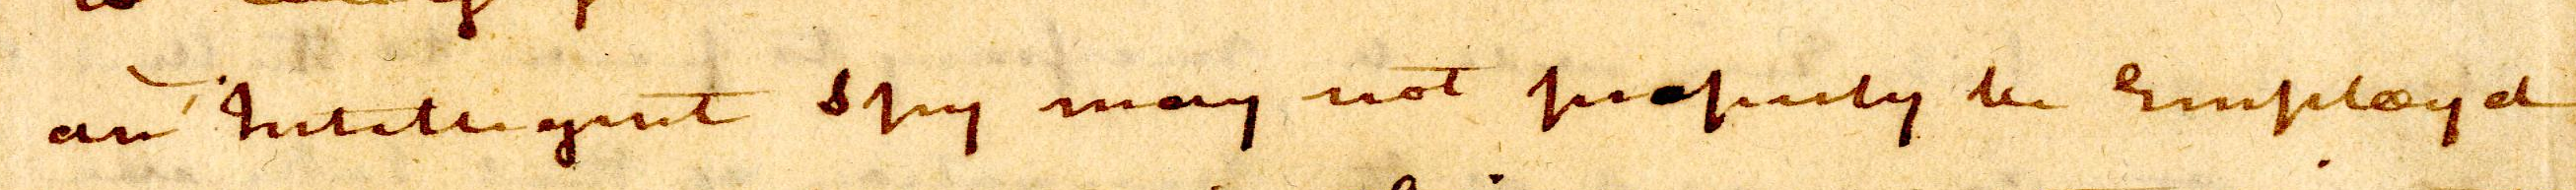an Intelligent Spy may not properly be Employed
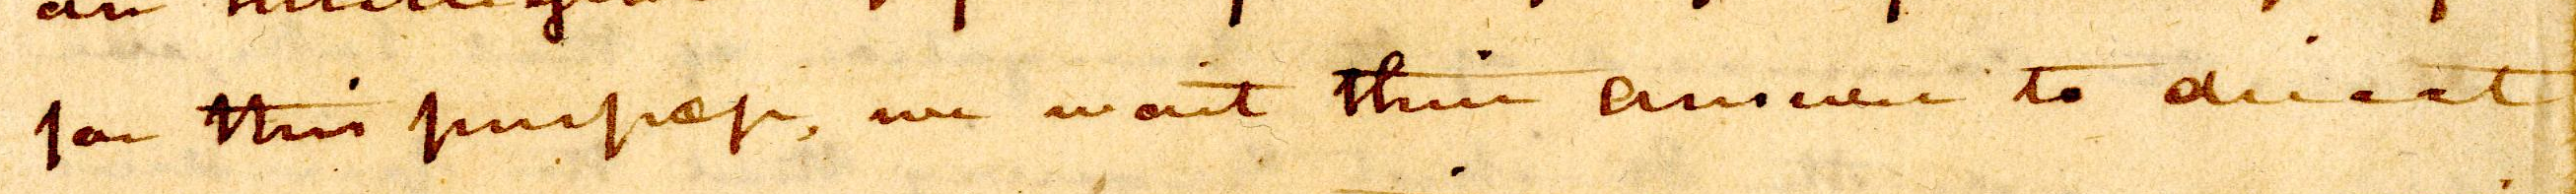for this purpose, we want their answer to direct
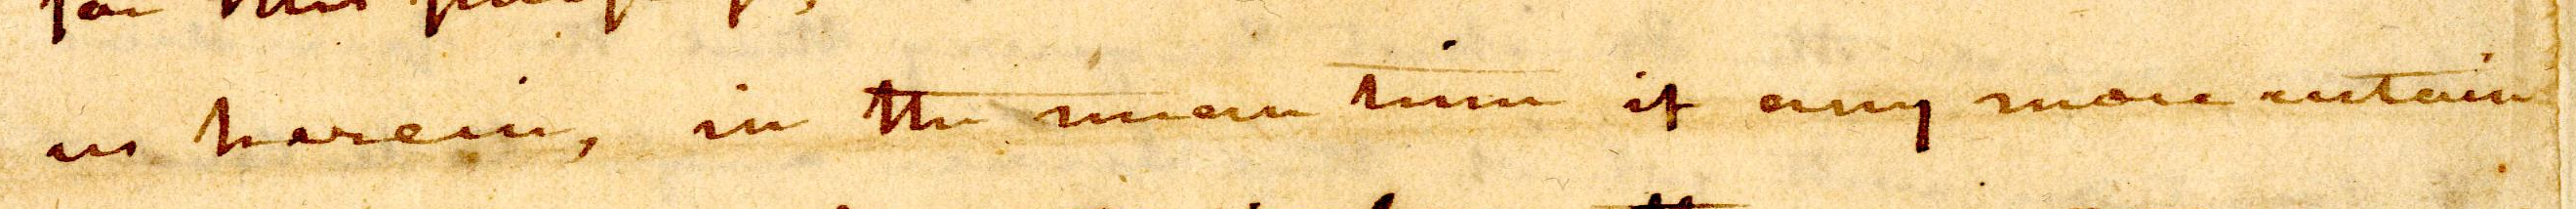us herein, in the mean time if any more certain
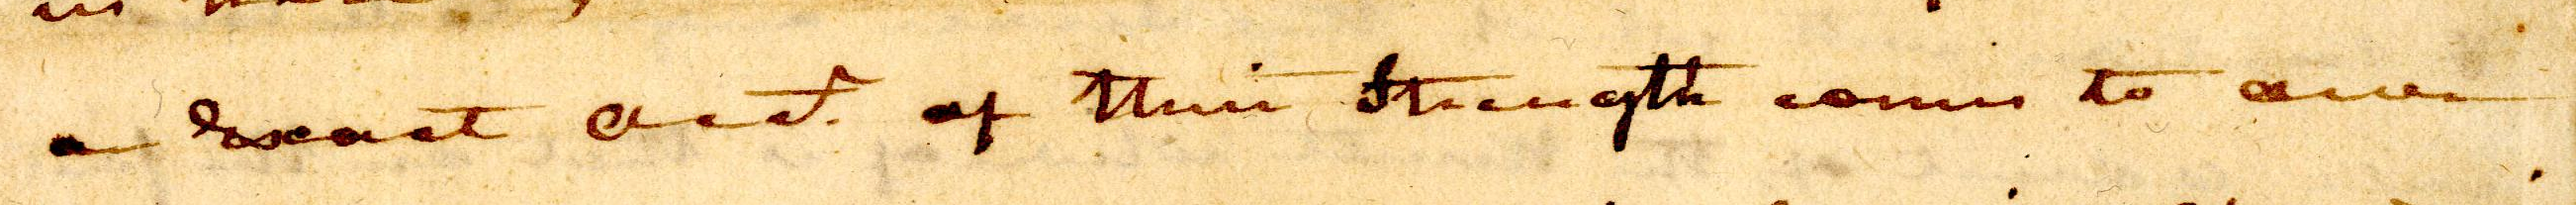a recent acct of their Strength comes to our
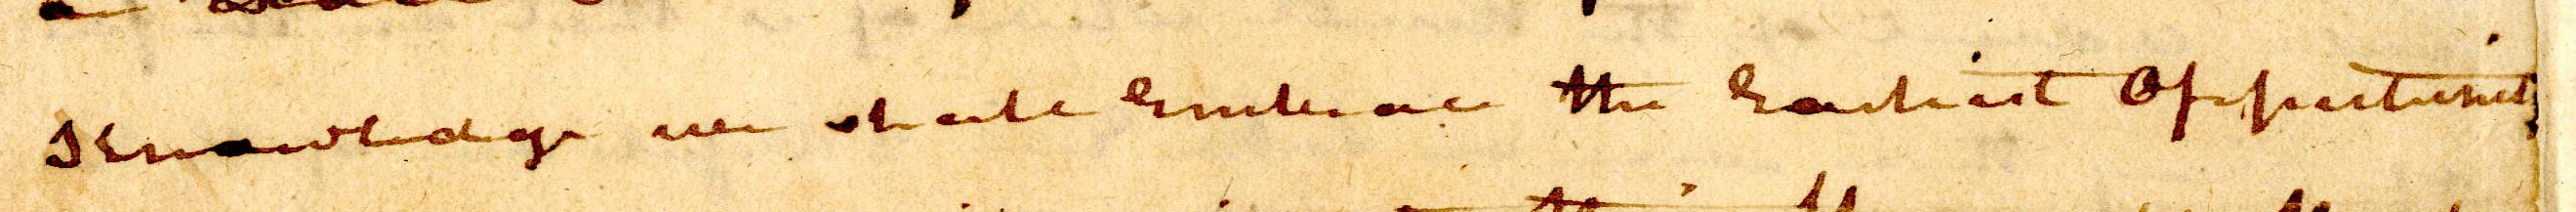Knowledge we shall Embrace the Earliest Opportunity
